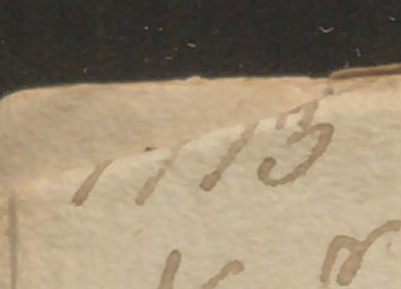1773
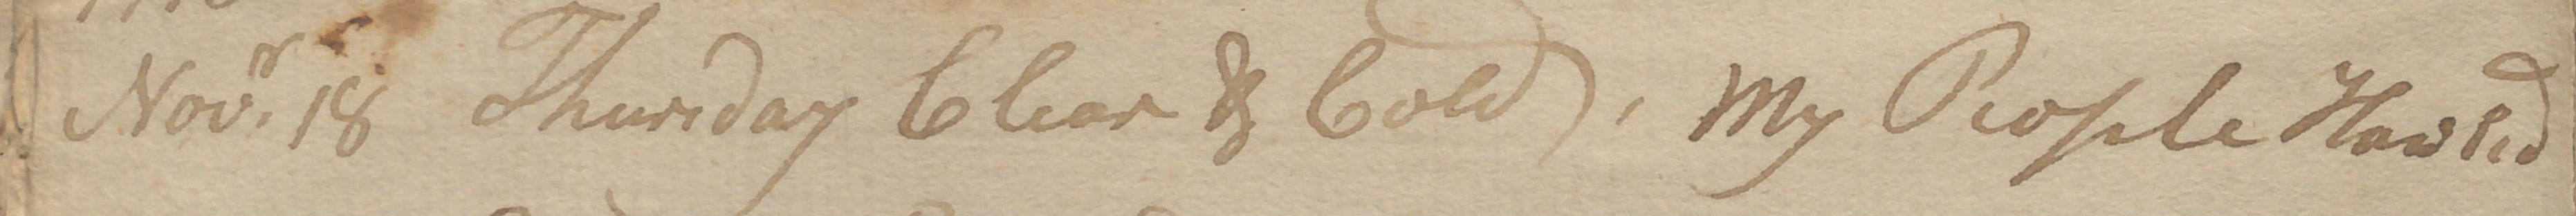Nov^r. 18 Thursday Clear & Cold, My People Hawled
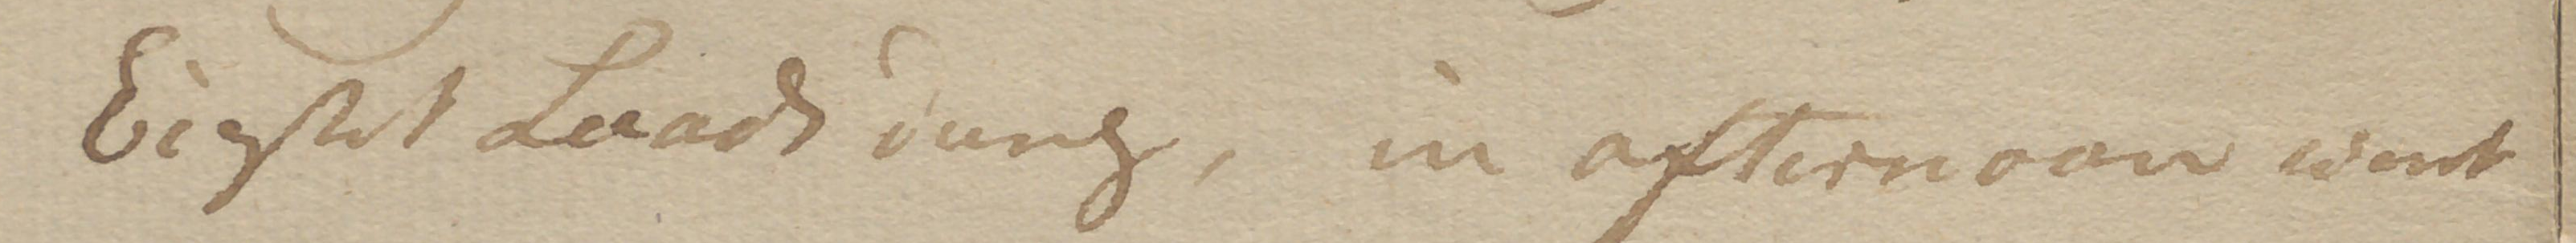Eight Loads dung, in afternoon went
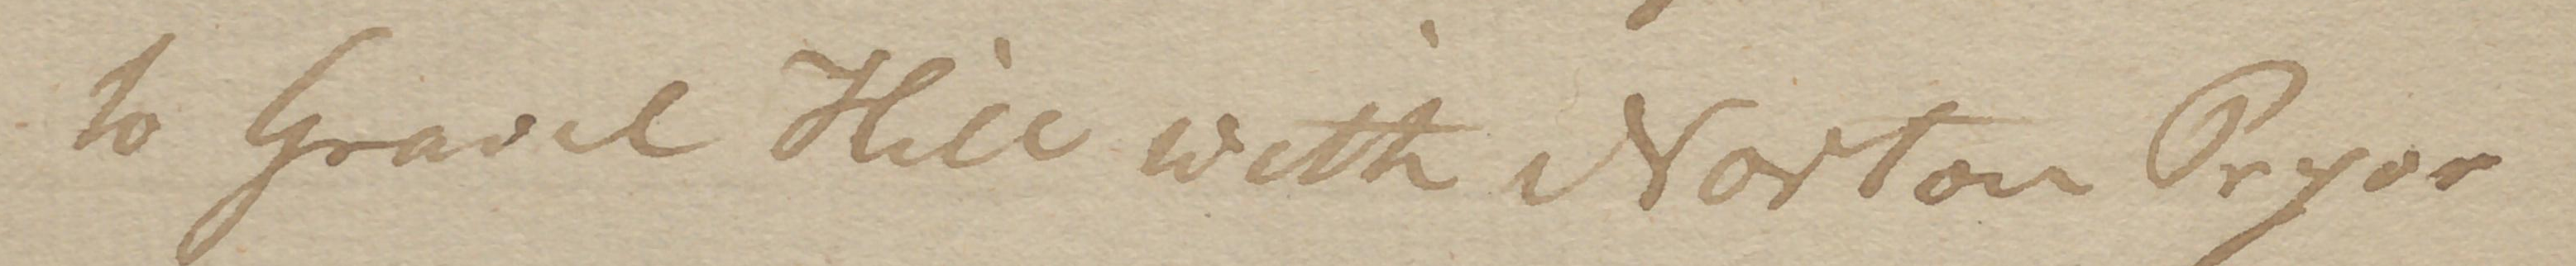to Gravel Hill with Norton Pryor
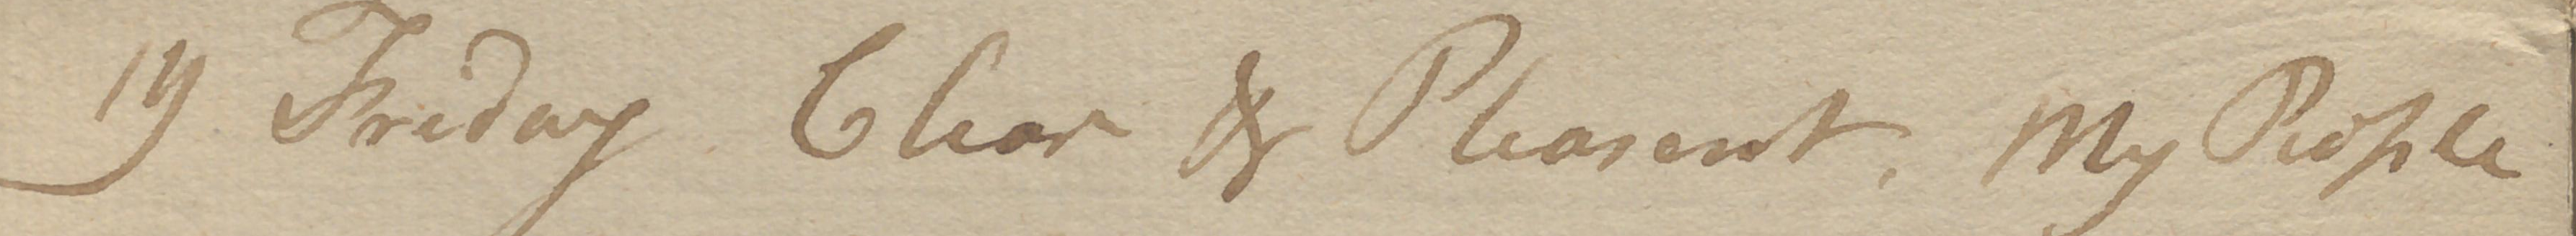19 Friday Clear & Pleasent. My People
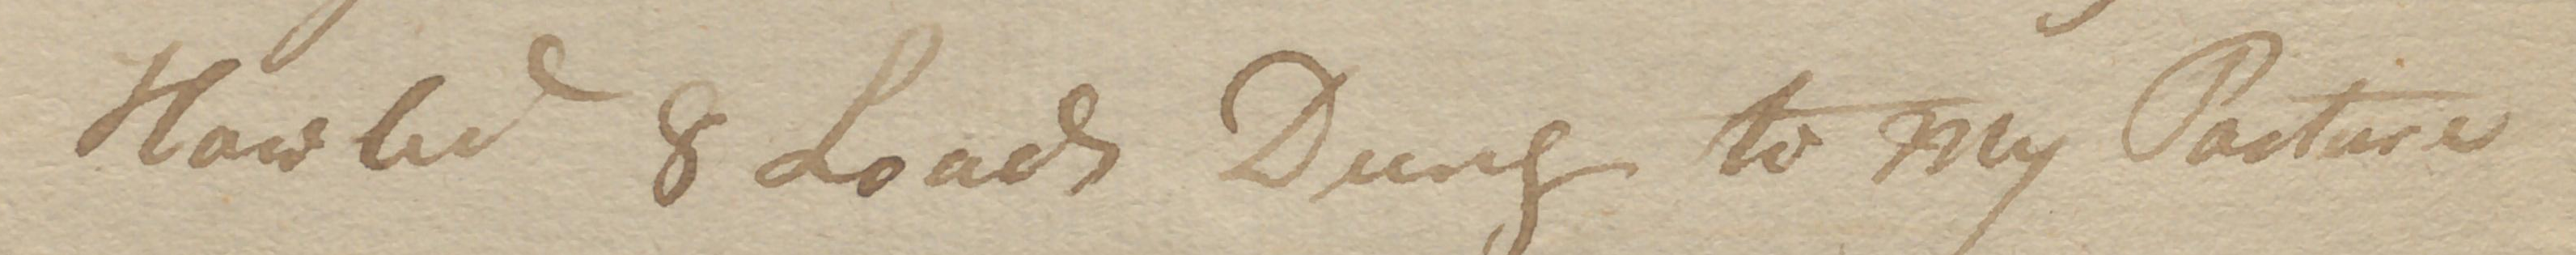Hawled 8 Loads Dung to My Pasture
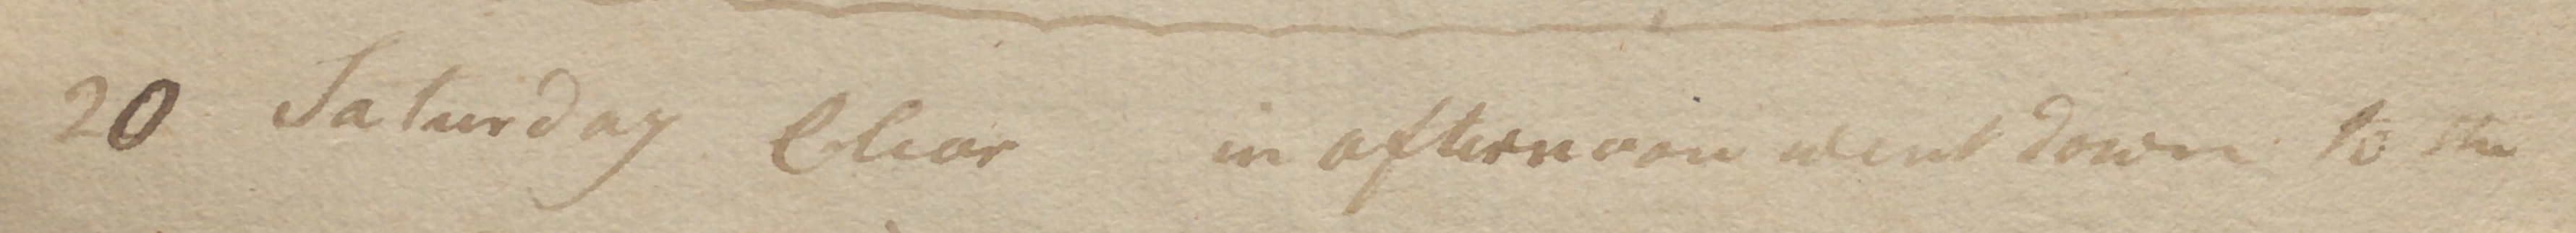20 Saturday Clear in afternoon went down to he
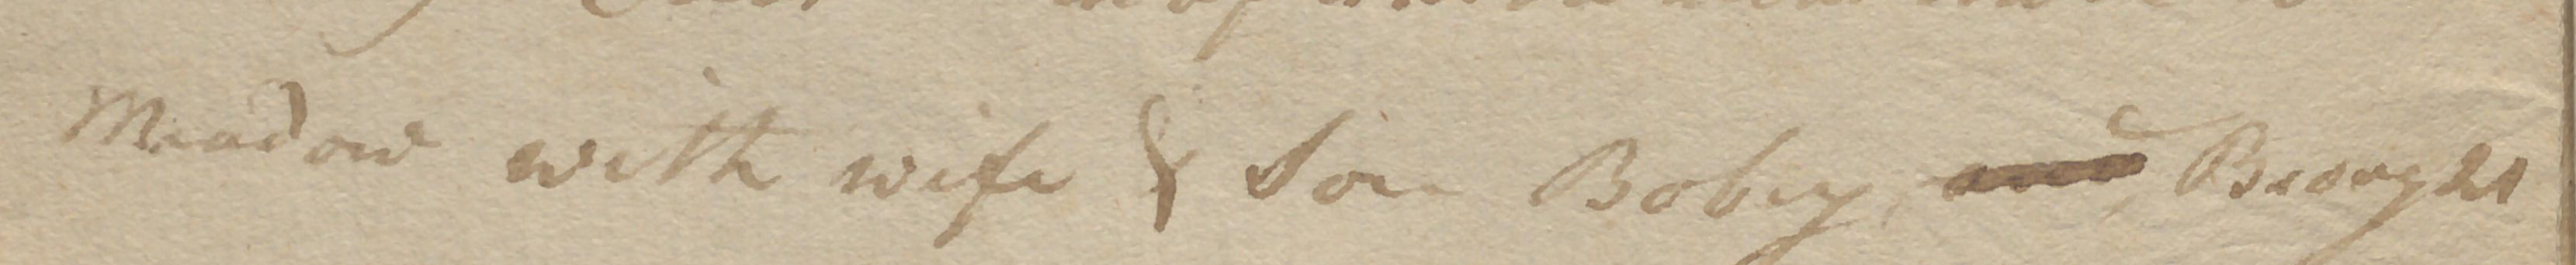Meadow with wife & Son Bobey, [and] Brought
